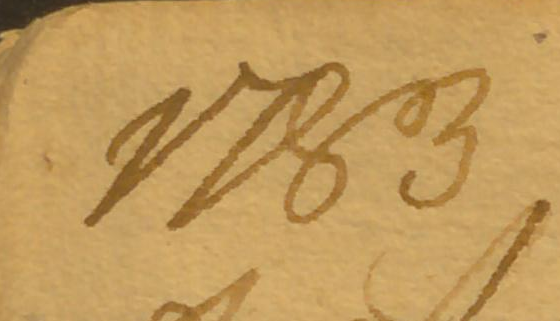1783
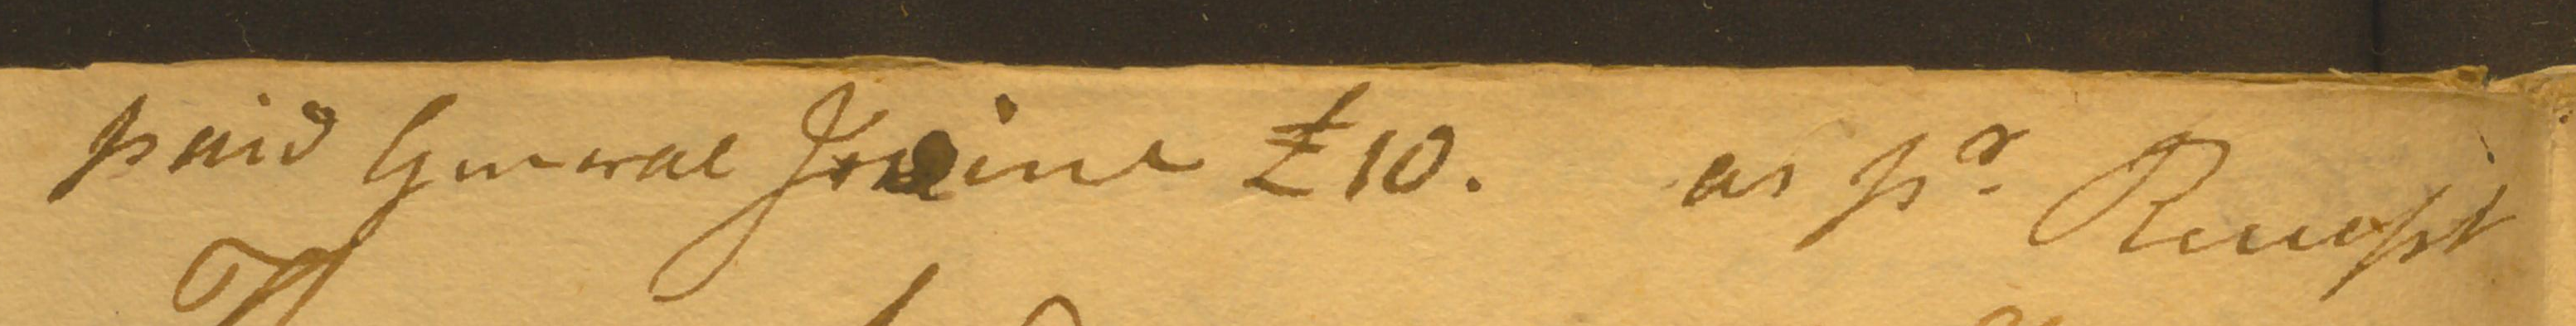paid General Irvine £10. as p^r. Receipt
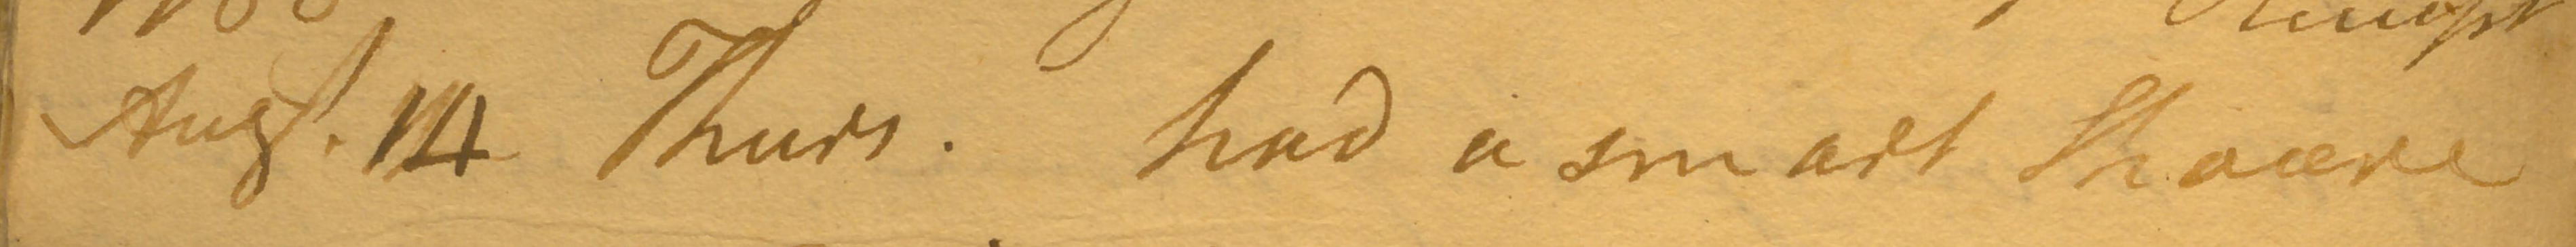Aug^t. 14 Thurs. had a smart shoure
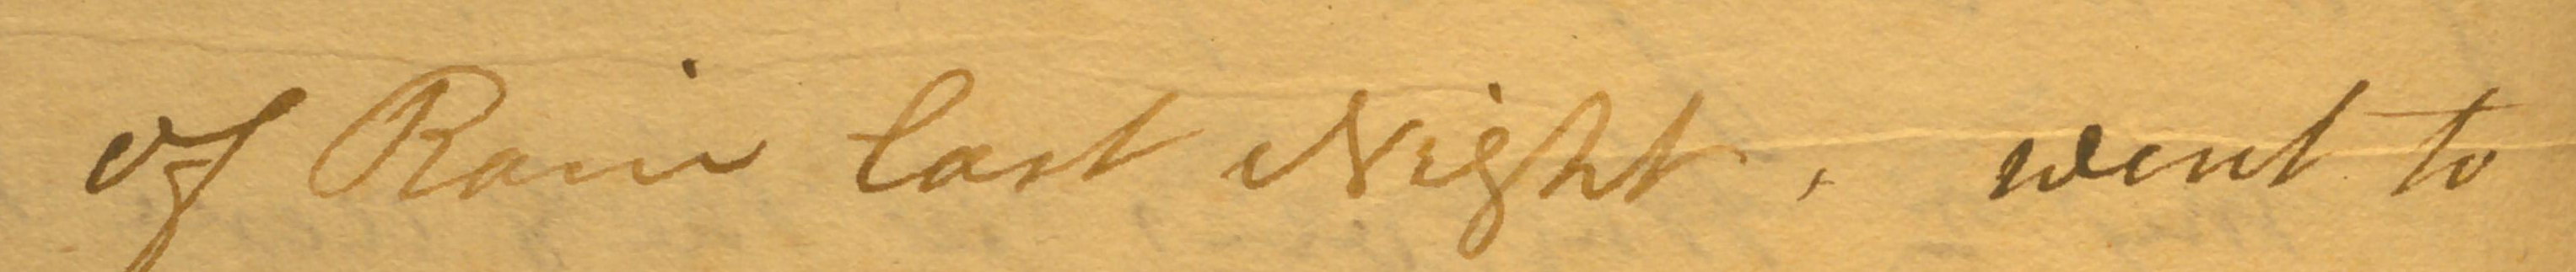of Rain last Night, went to
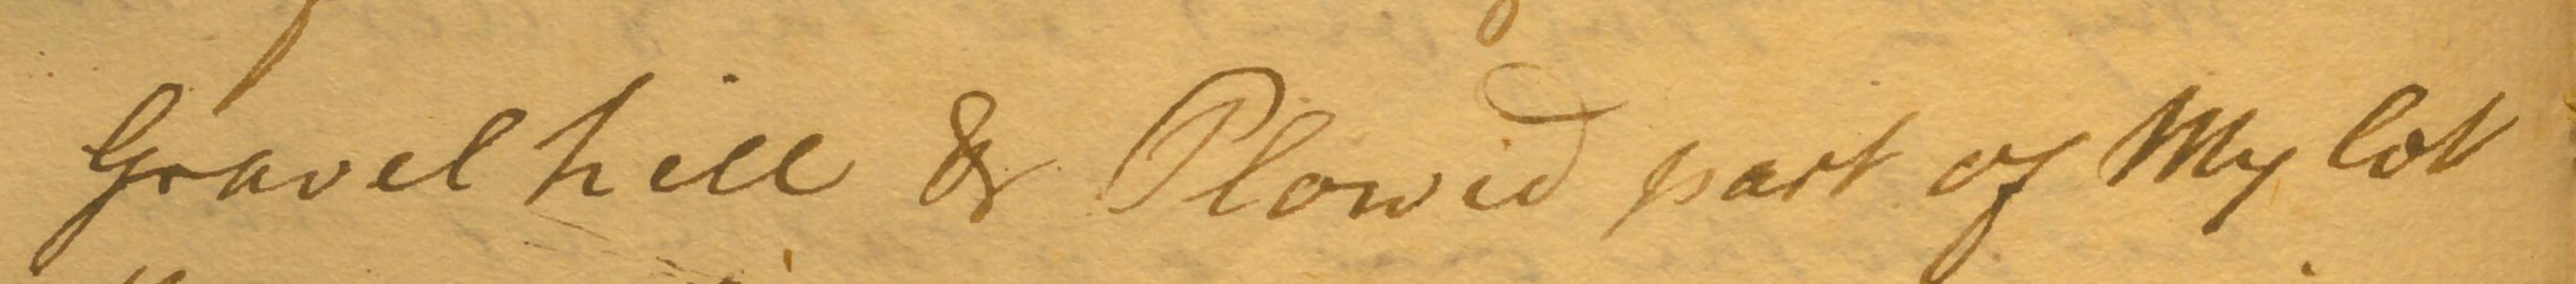Gravelhill & Plowed part of My lot
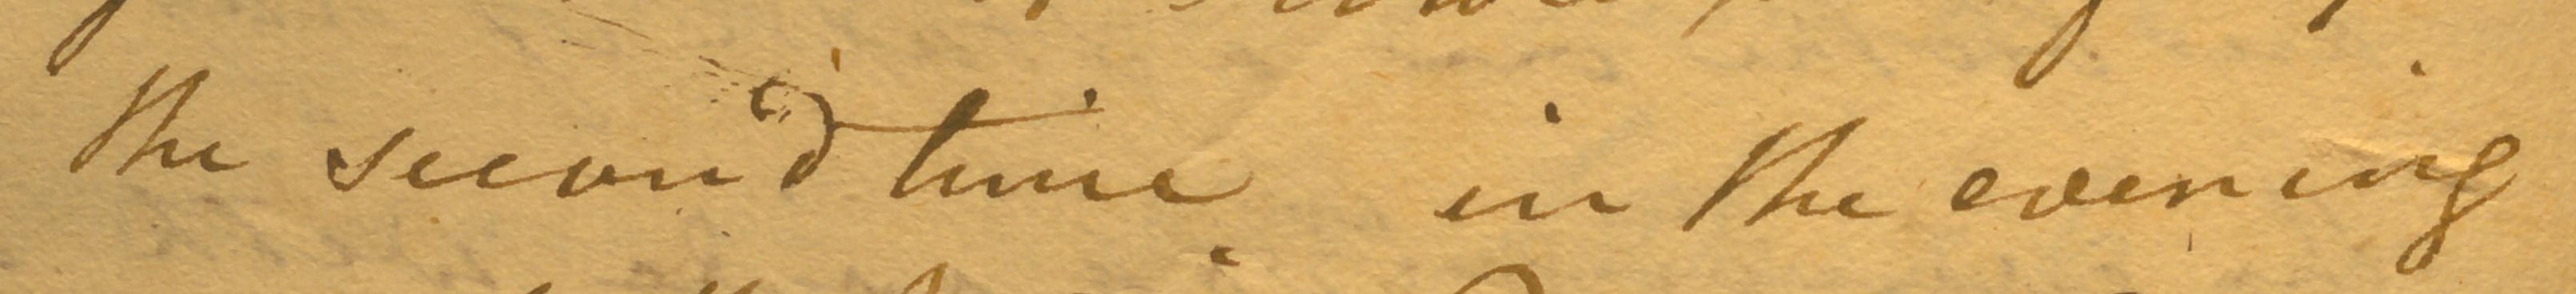the second time, in the evening
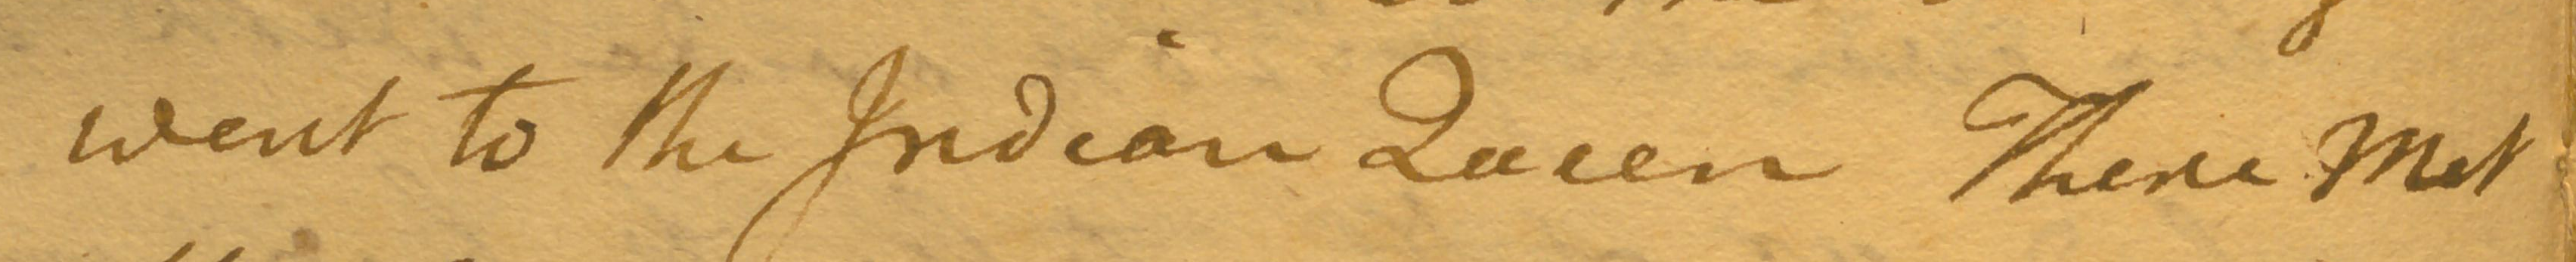went to the Indian Queen There Met
